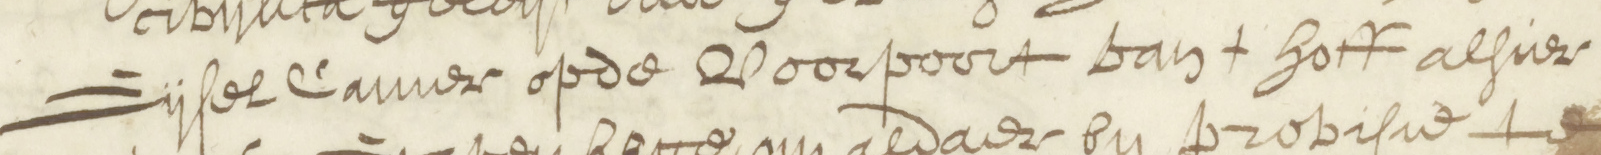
Gijsel Camer opde Voorpoort van t hoff alhier
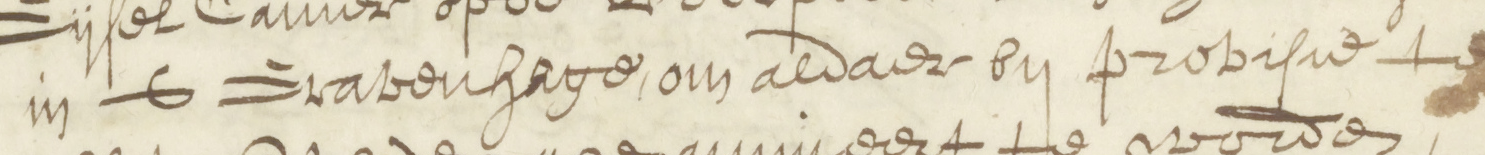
in s Gravenhage, om aldaer by provisie te
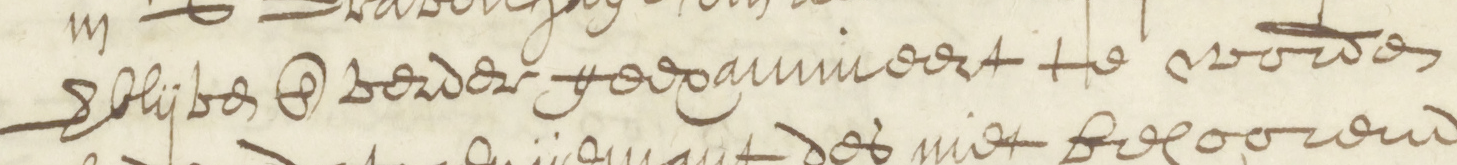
vblijven & verder geexamineert te worden
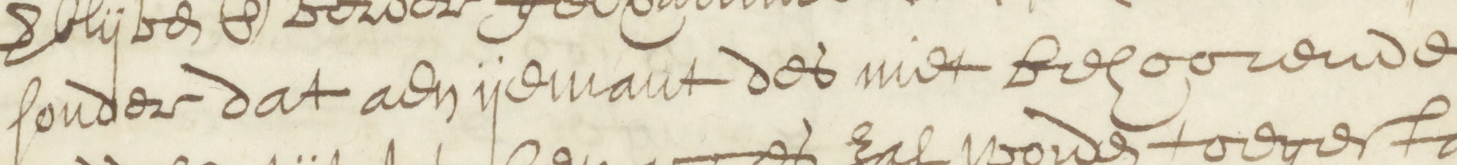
sonder dat aen yemant des niet behoorende
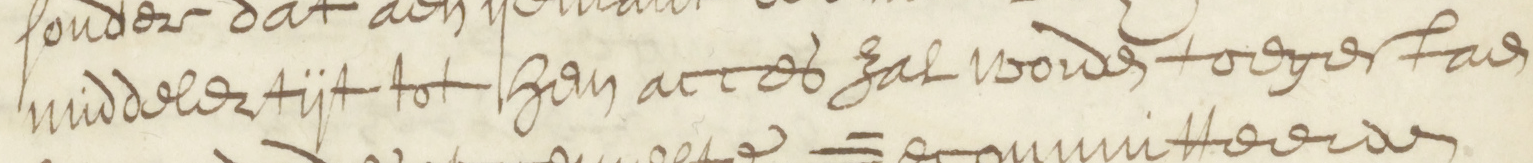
middelertijt tot hem acces zal worden toegestaen
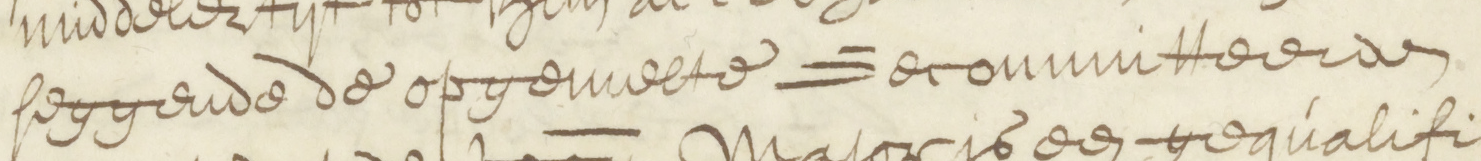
seggende de opgemelte Gecommitteerden
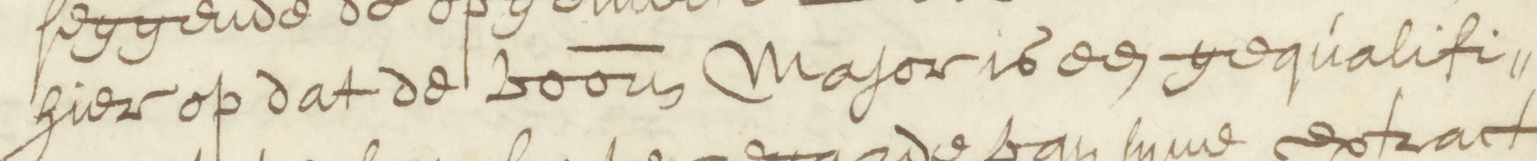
hier op dat de voorn Major is een gequalifi„
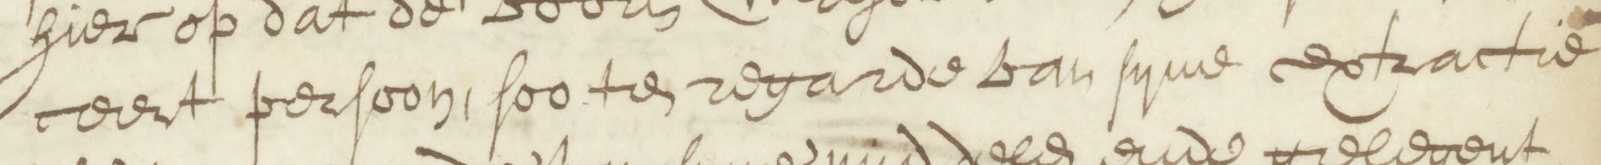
ceert persoon, soo ten regarde van syne extractie
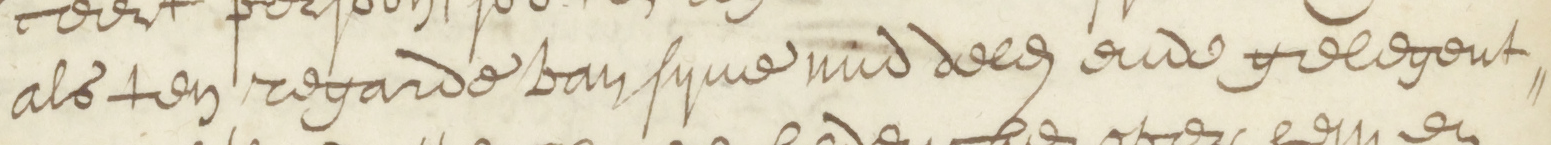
als ten regarde van syne middelen ende gelegent,,
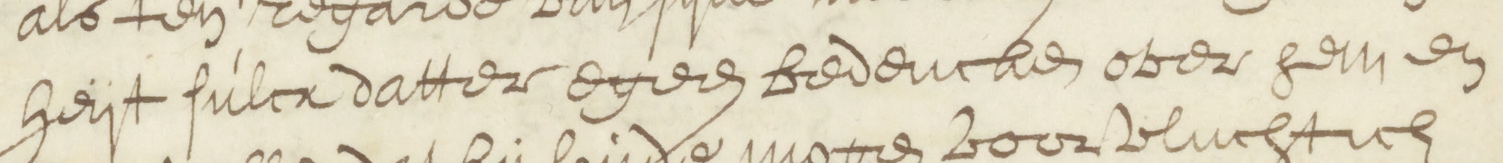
heijt sulcx datter egeen bedencken over hem en
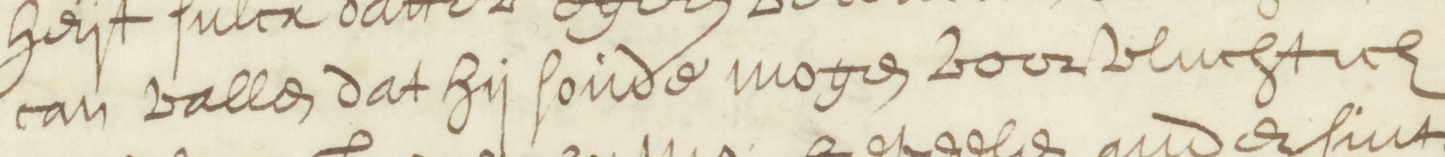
can vallen dat hij soude mogen voorvluchtich
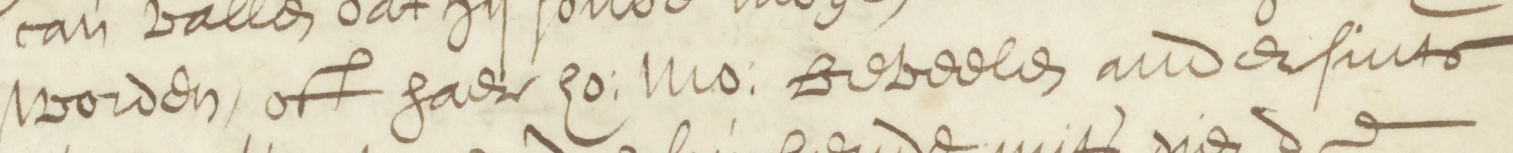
worden, off haer ho:Mo: beveelen andersints
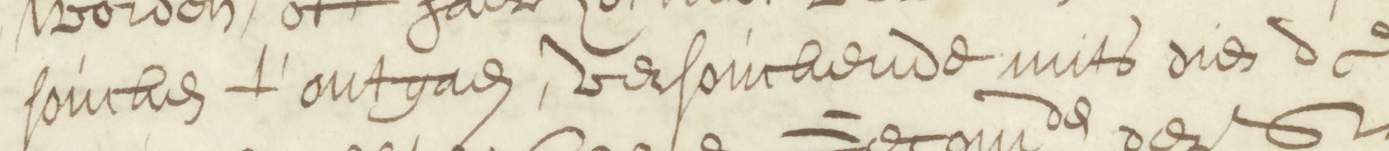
soucken t'ontgaen, versouckende mits dien de
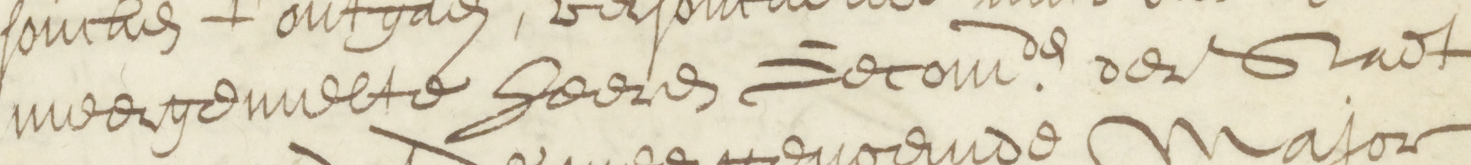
meergemelte heeren Gecomden. der Stadt
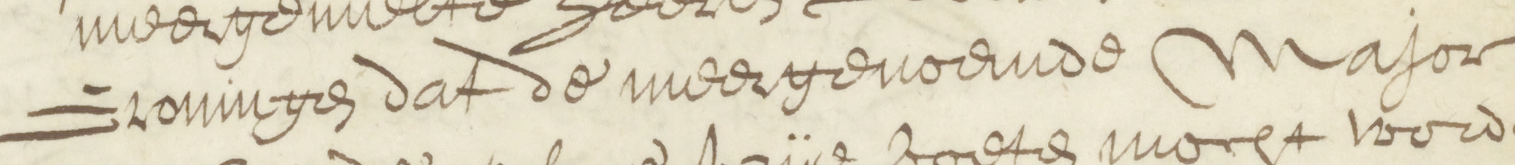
Groningen dat de meergenoemde Major
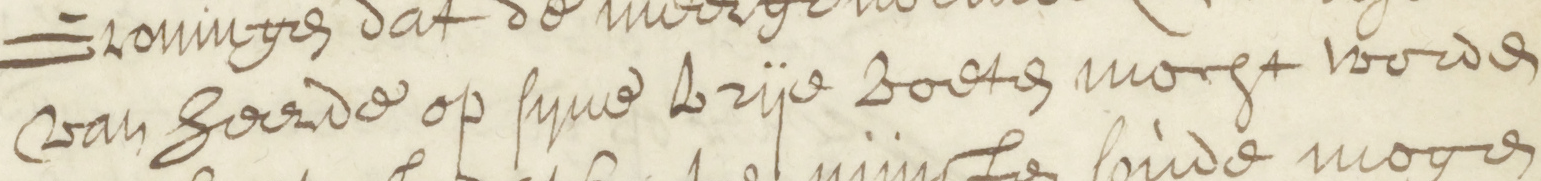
van heerde op syne vrije voeten mocht worden
